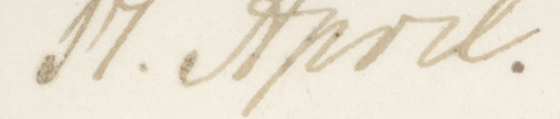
17. April.
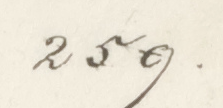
259.
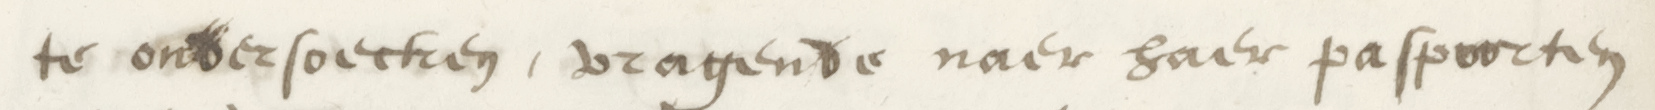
te ondersoecken, vragende naer haer paspoorten
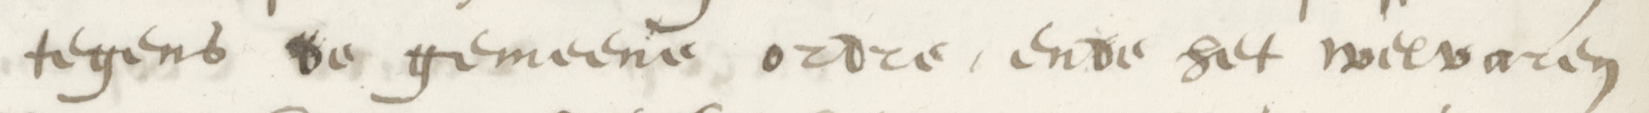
tegens de gemeene ordre, ende het welvaren
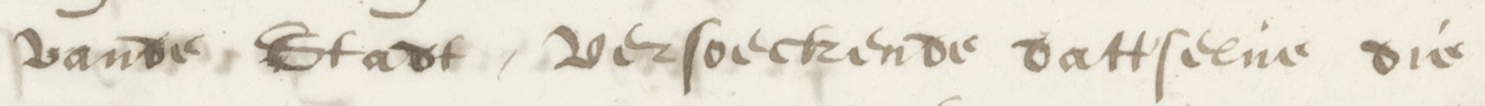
vande Stadt, versoeckende datt'selue die
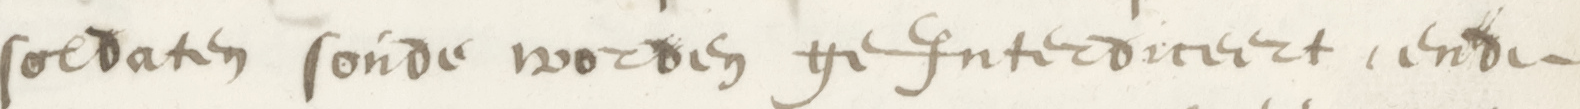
soldaten soude worden geinterdiceert, ende
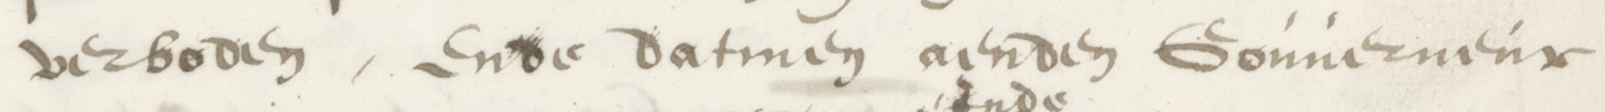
verboden, Ende datmen aenden Gouuerneur
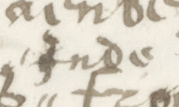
,Inde
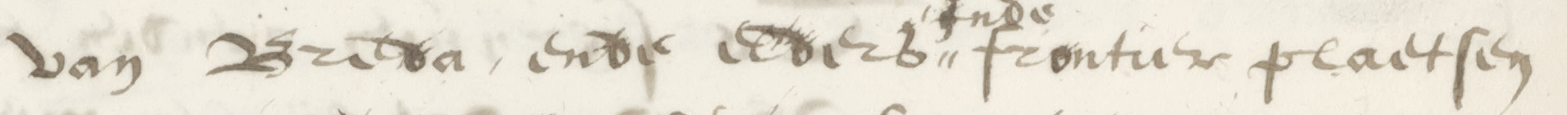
van Breda, ende elders,, frontier plaetsen
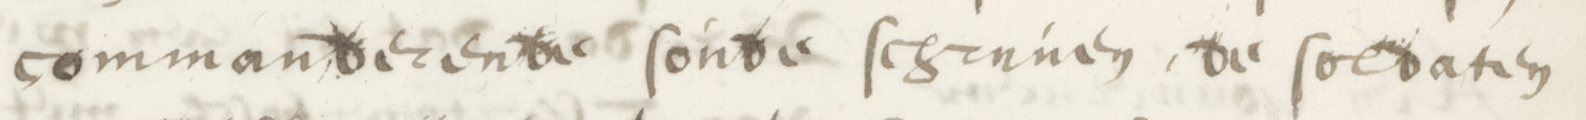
commanderende soude schryuen, de soldaten
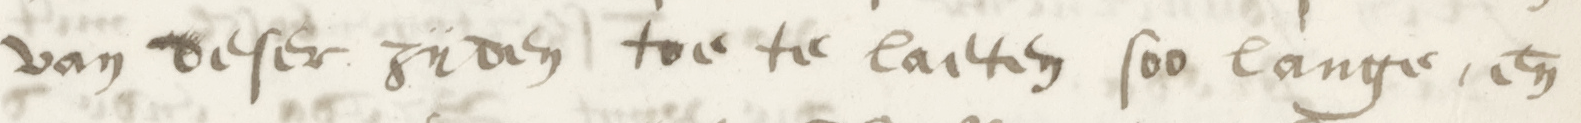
van deser zyden toe te laeten soo lange, en
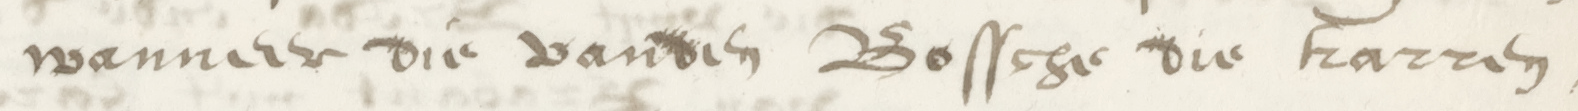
wanneer die vanden Bossche die karren
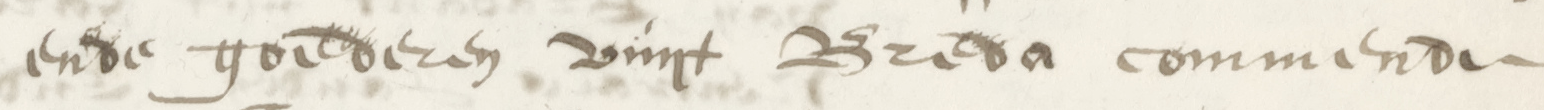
ende goederen vuyt Breda commende
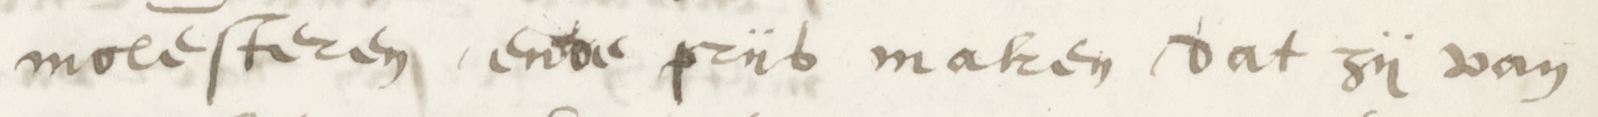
molesteren, ende prijs maken, dat zij van
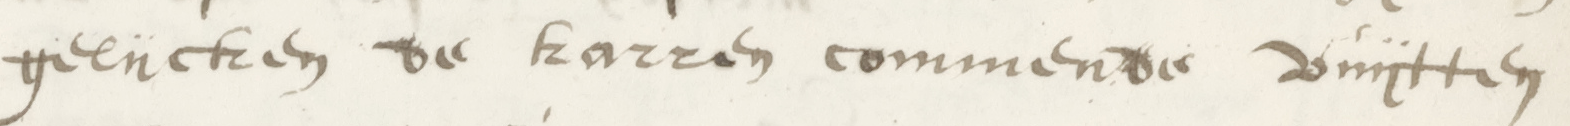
gelijcken de karren commende vuijtten
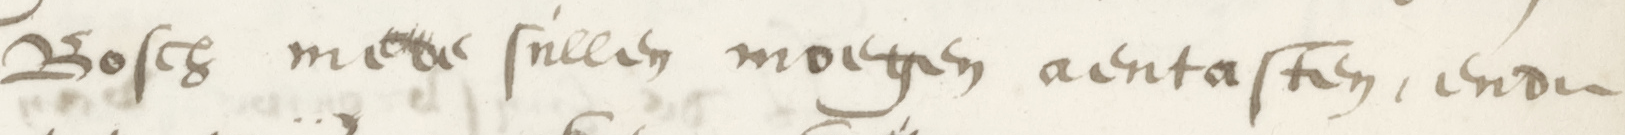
Bosch mede sullen moegen aentasten, ende
